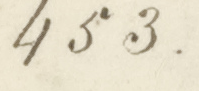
453.
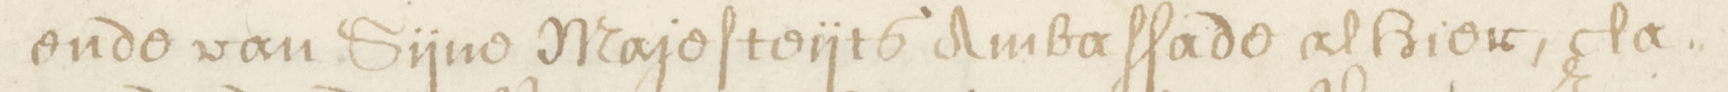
ende van Sijne Majesteijts Ambassade alhier, cla,,
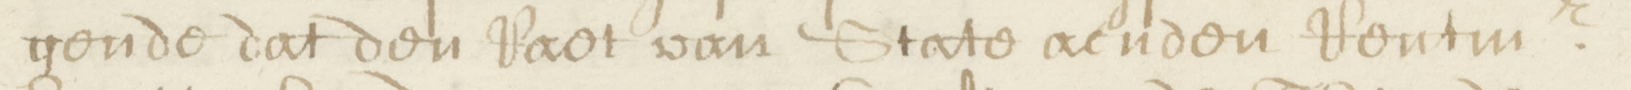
gende dat den Raet van State aenden Rentmr,
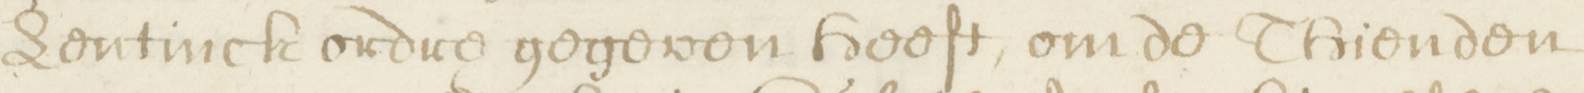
Lentinck ordre gegeven heeft, om de Thienden
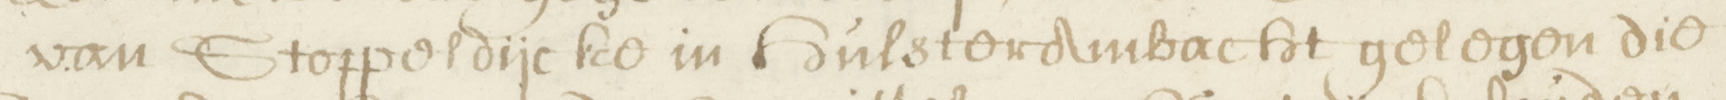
van Stoppeldijcke in Hulsterdambacht gelegen die
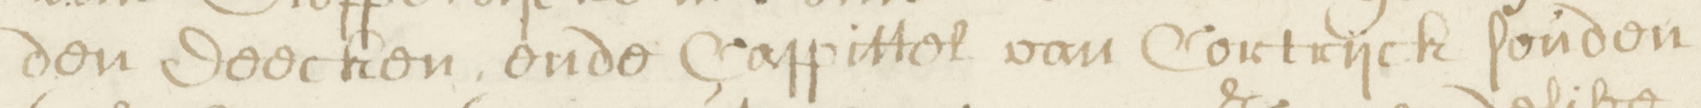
den Deecken, ende Cappittel van Cortrijck souden
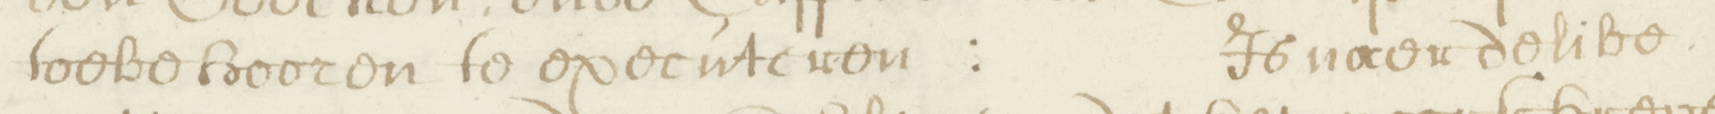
toebehooren te executeren: Is naer delibe„
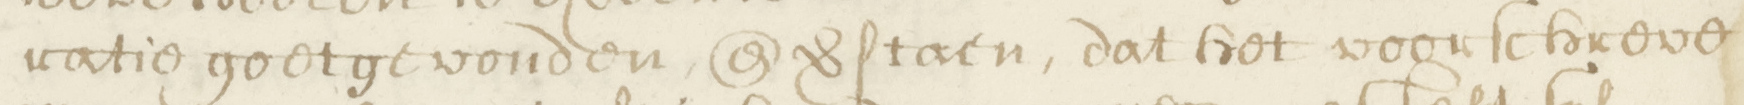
ratie goetgevonden, & vstaen, dat het voorschreve
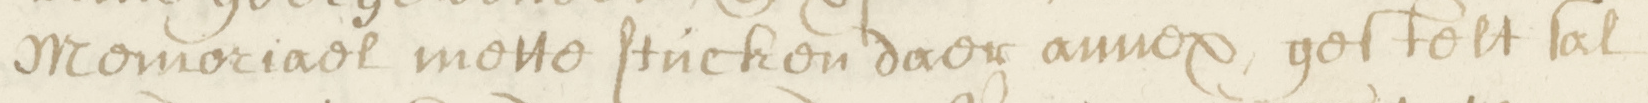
Memoriael mette stucken daer annex, gestelt sal
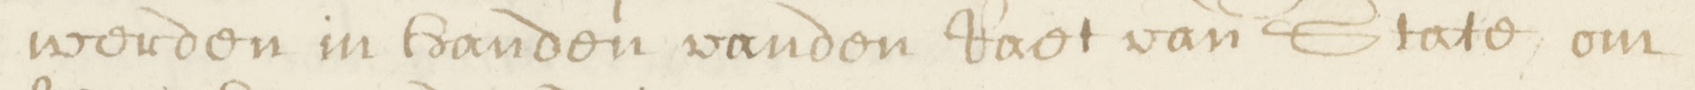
werden in handen vanden Raet van State, om
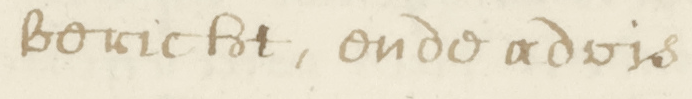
bericht, ende advis
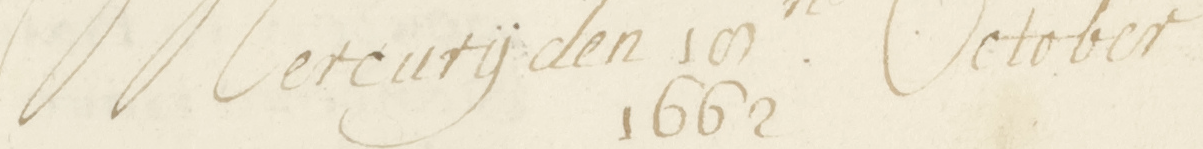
Mercurij den 18n October
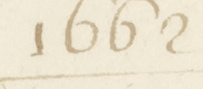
1662
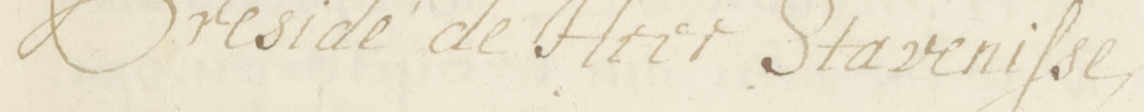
Preside de Heer Stavenisse,
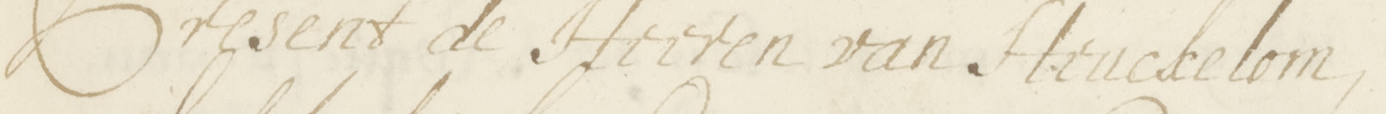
Present de Heeren van Heuckelom,
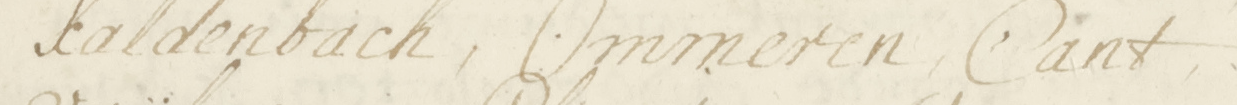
Kaldenbach, Ommeren, Cant,
